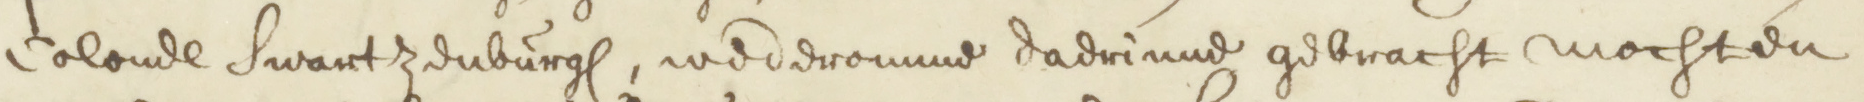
Colonel Swartzenburgh, wederomme daerinne gebracht mochten
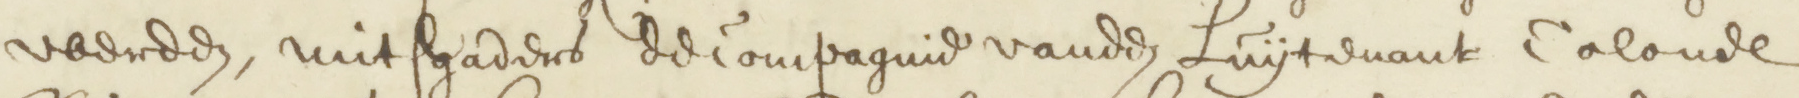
werden, mitsgaders de Compagnie vanden Luijtenant Colonel
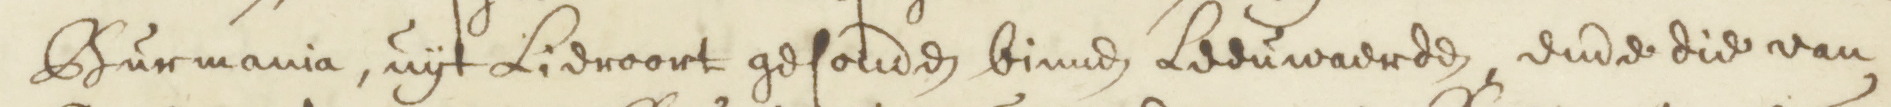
Burmania, uijt Lieroort gesonden binnen Leeuwaerden, ende die van
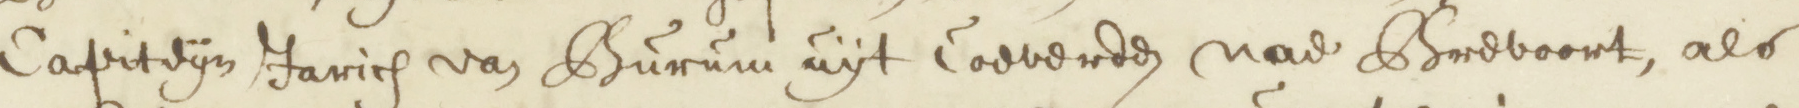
Capiteijn Jarich van Burum uijt Coeverden nae Brevoort, als
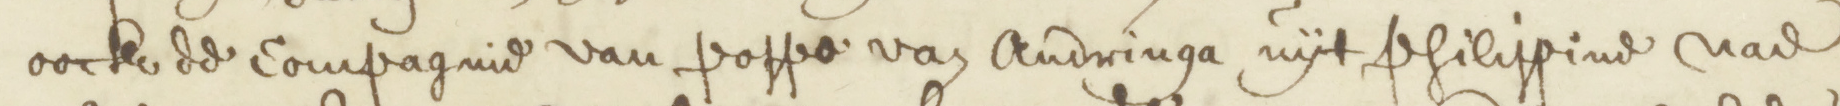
oock de Compagnie van Poppo van Andringa uijt Philippine nae
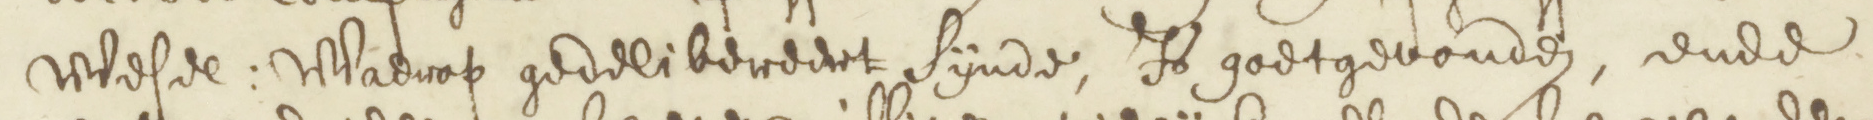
Wesel: Waerop gedelibereert sijnde, Is goetgevonden, ende
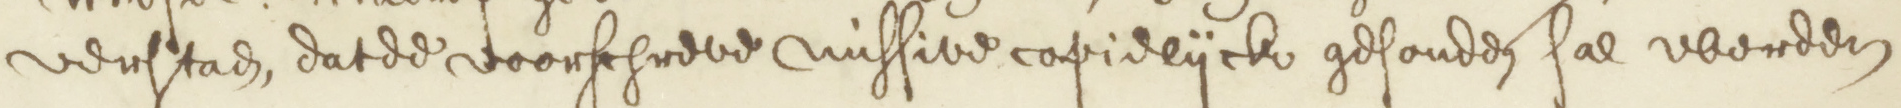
verstaen, dat de voorschreve missive copielijck gesonden sal werden
